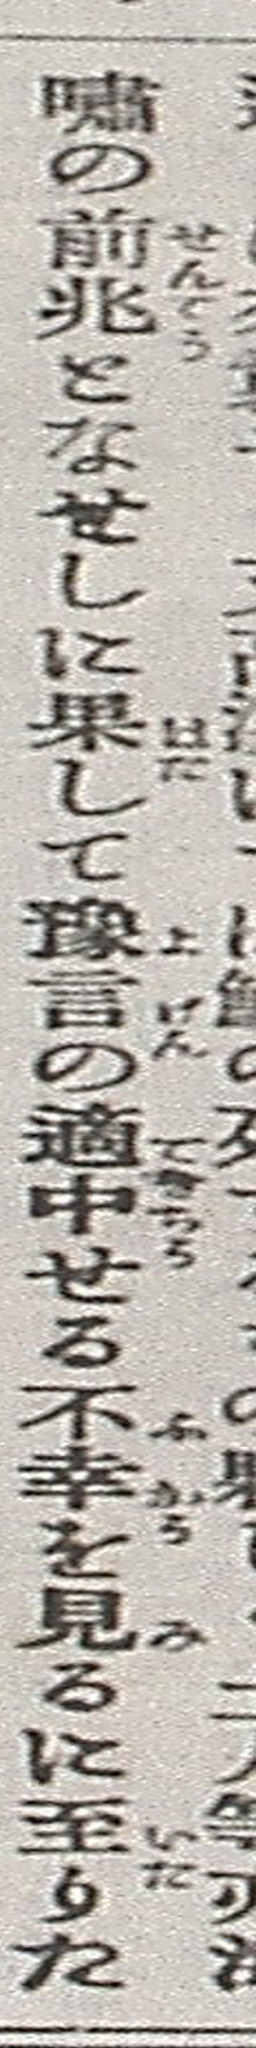嘯の前兆となせしに果して予言の適中せる不幸を見るに至りた
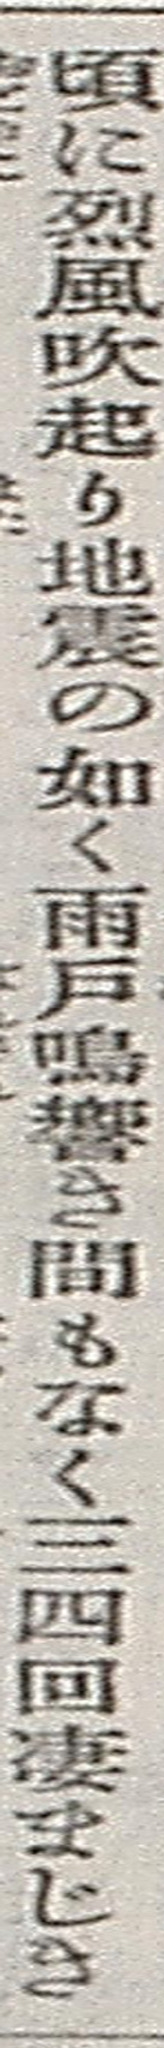頃に烈風吹起り地震の如く雨戸鳴響き間もなく三四回凄まじき
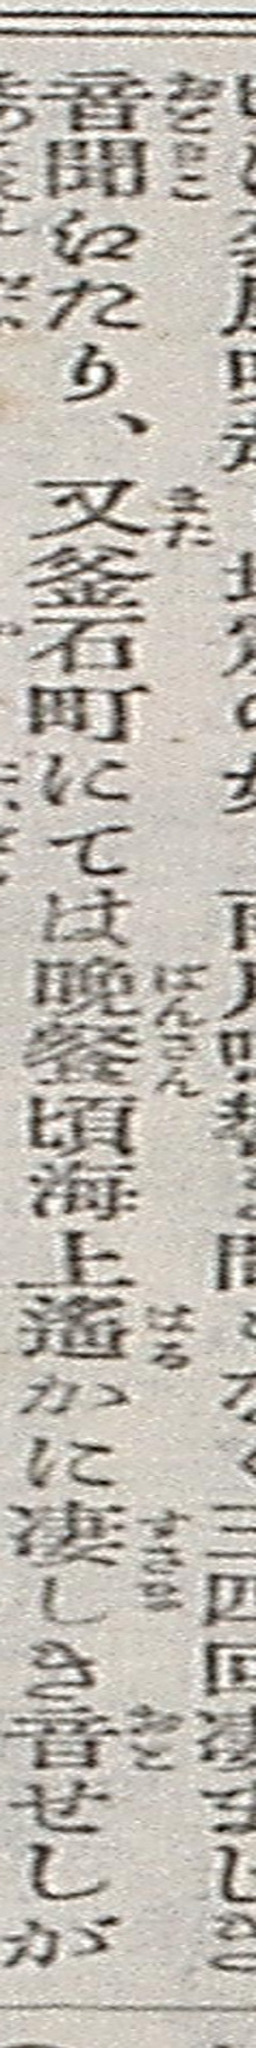音聞えたり、又釜石町にては晩餐頃海上遙かに凄じき音せしが
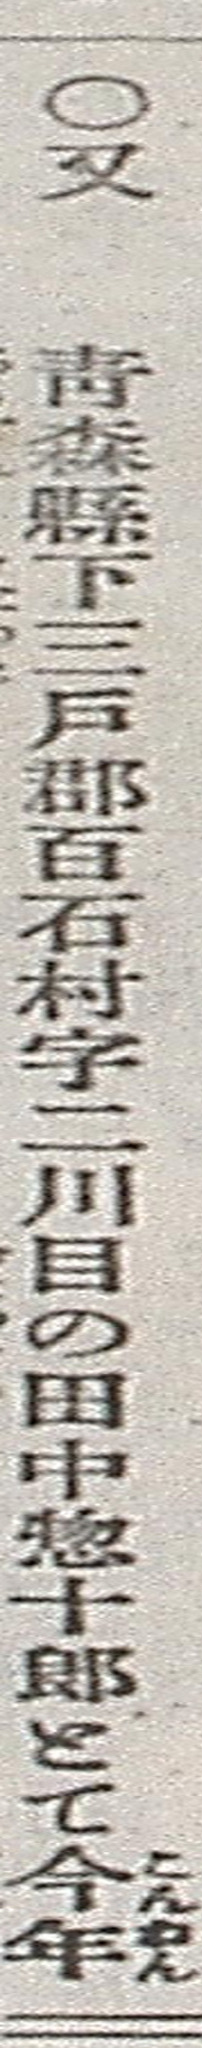○又青森県下三戸郡百石村字二川目の田中惣十郎とて今年
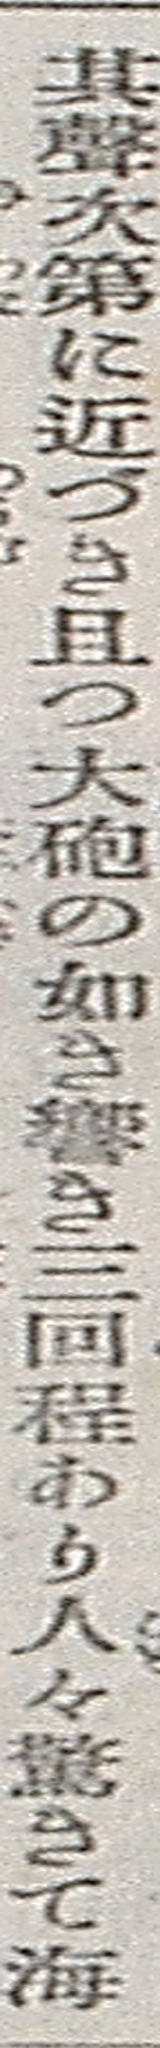其声次第に近づき且つ大砲の如き響き三回程あり人々驚きて海
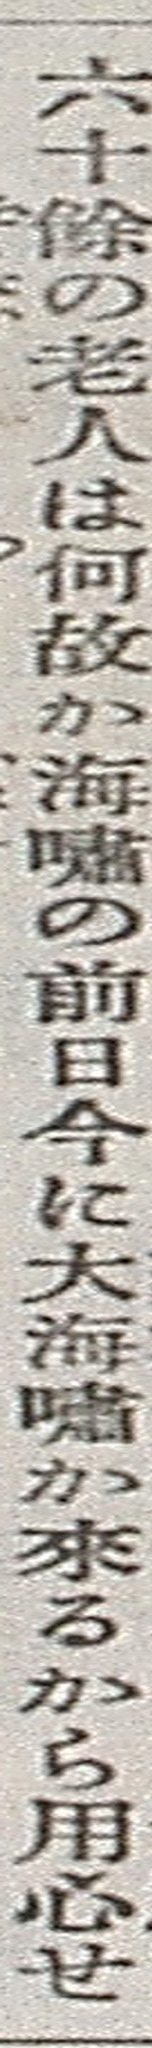六十余の老人は何故か海嘯の前日今に大海嘯か来るから用心せ
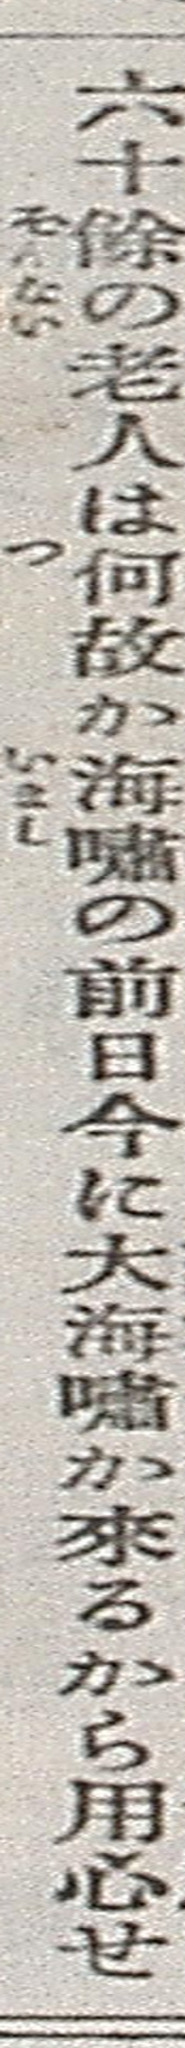六十余の老人は何故か海嘯の前日今に大海嘯か来るから用心せ
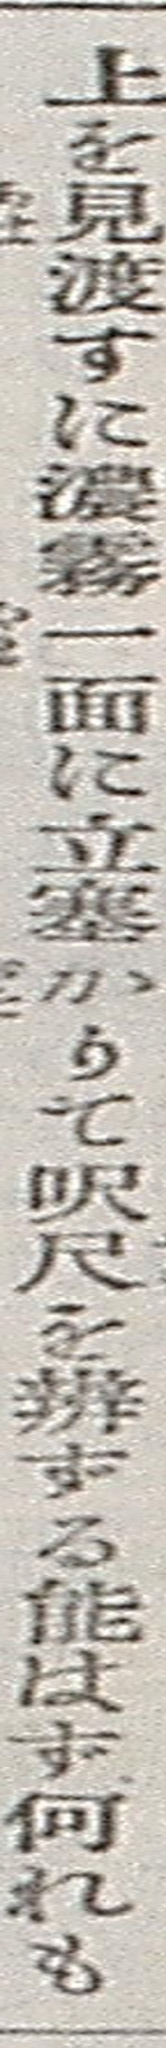上を見渡すに濃霧一面に立塞かりて呎尺を弁ずる能はず何れも
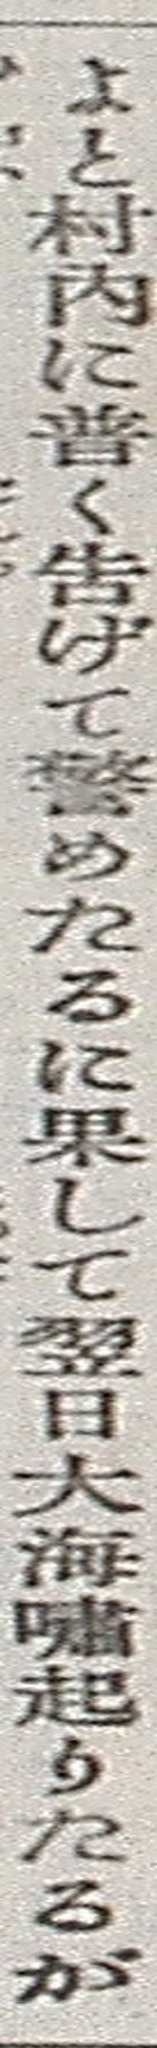よと村内に普く告げて警めたるに果して翌日大海嘯起りたるが
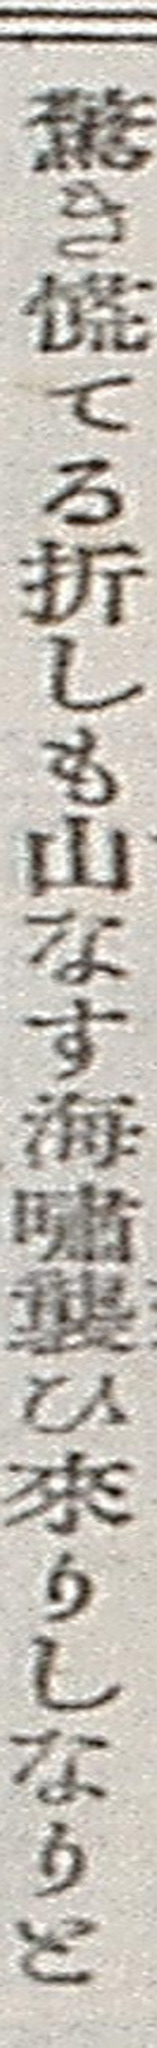驚き慌てる折しも山なす海嘯襲ひ来りしなりと
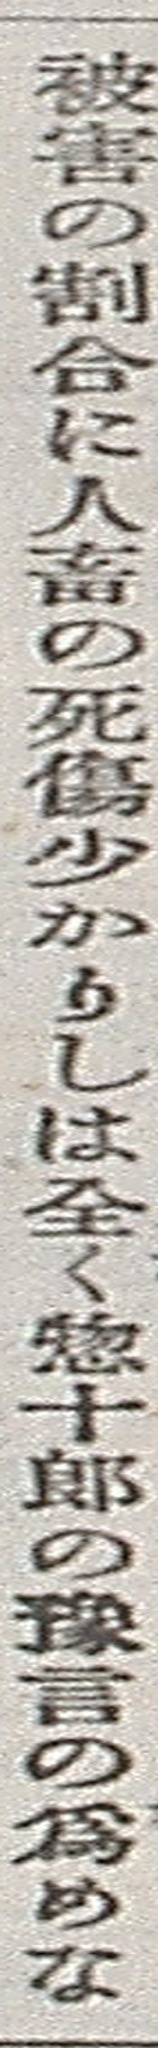被害の割合に人畜の死傷少かりしは全く惣十郎の予言の為めな
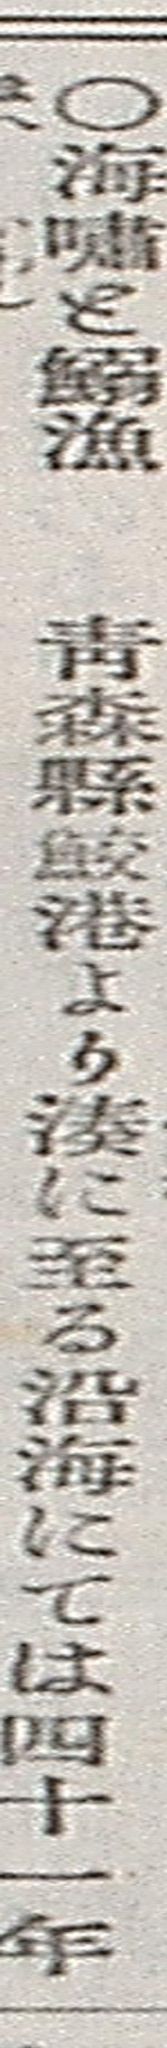○海嘯と鰯漁青森県鮫港より湊に至る沿海にては四十一年
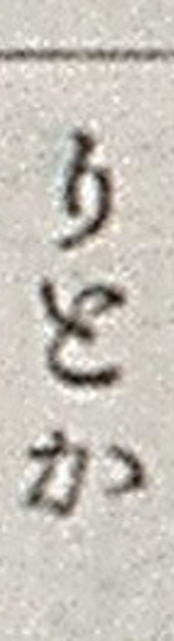りとか
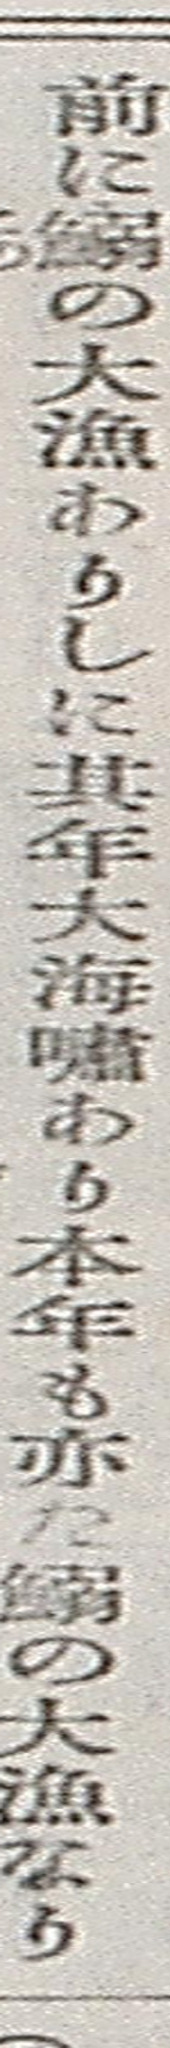前に鰯の大漁ありしに其年大海嘯あり本年も亦た鰯の大漁なり
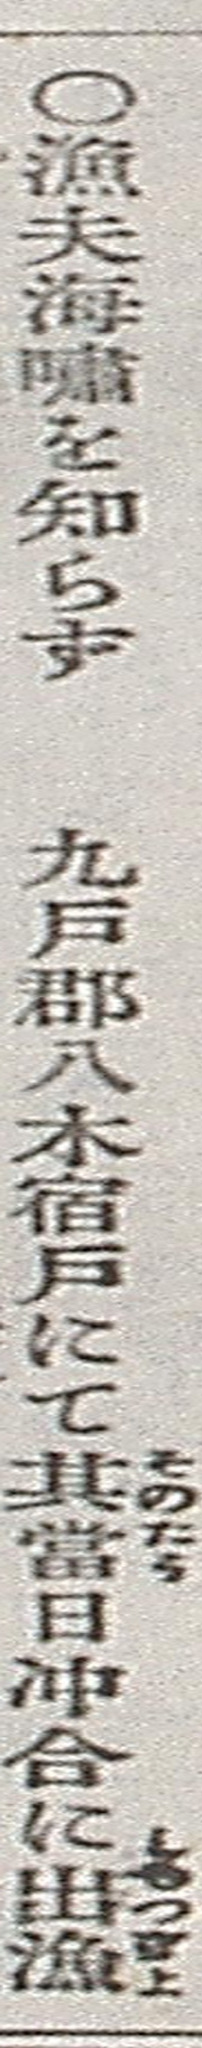○漁夫海嘯を知らず九戸郡八木宿戸にて其当日沖合に出漁
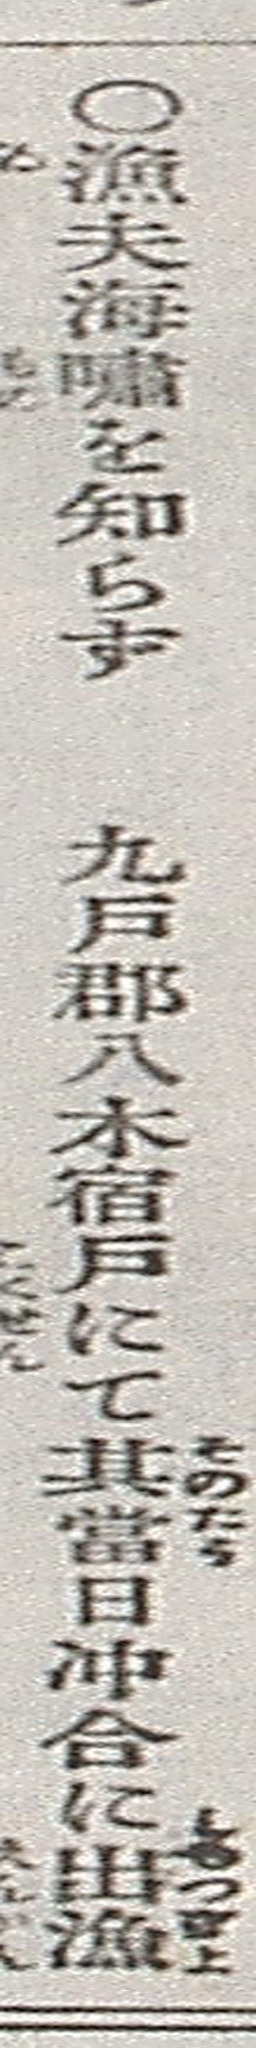○漁夫海嘯を知らず九戸郡八木宿戸にて其当日沖合に出漁
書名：風俗畫報臨時増刊第百二十號　大海嘯被害録（下）
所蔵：東京大学地震研究所図書室 Earthquake Research Institute Library, The University of Tokyo, JAPAN
